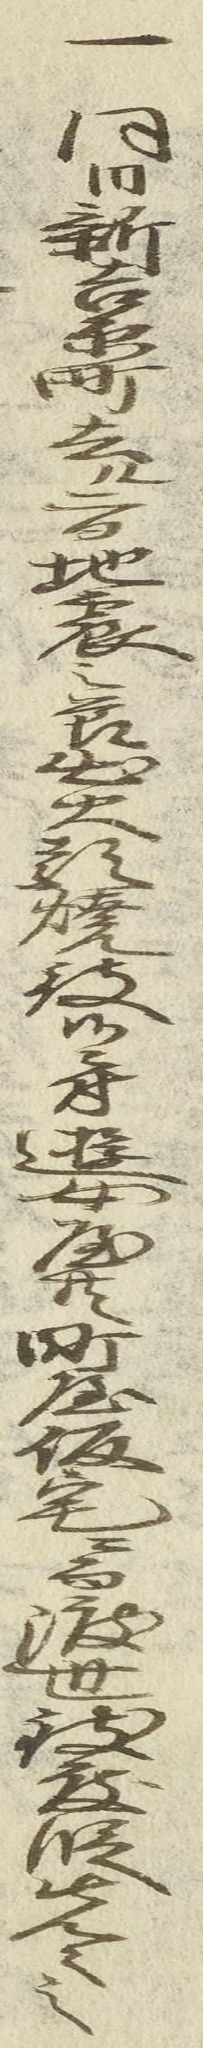一同日新吉原町去ル二日地震之節出火類焼致候ニ付遊女屋共町屋仮宅ニ而渡世致度段先々之
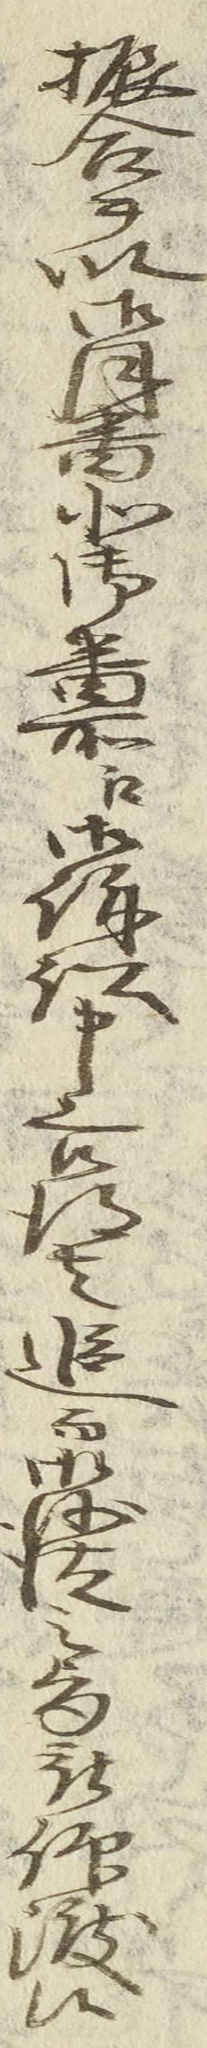振合ヲ以御月番北御番所江御訴訟申上候得者追而御沙汰之旨被仰渡候
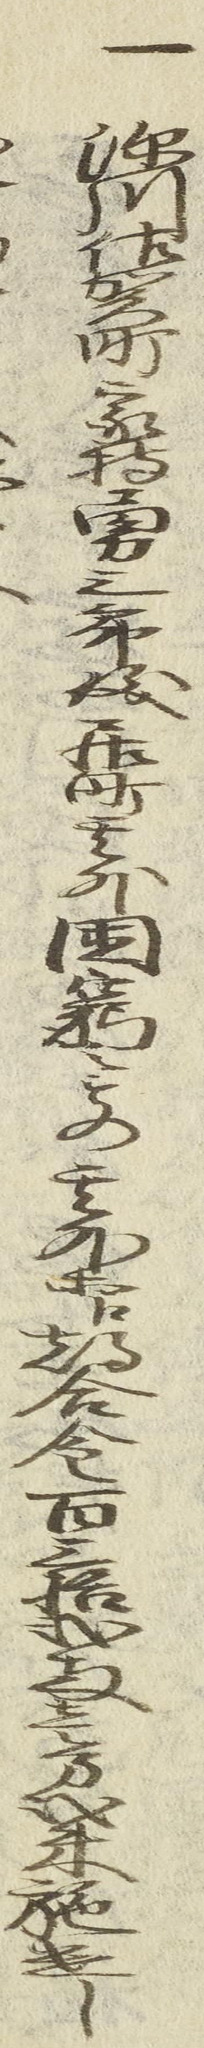一深川佐賀町家持勇三郎儀居町其外困窮之もの其外等江都合金百三拾弐両壱分弐朱施遣し
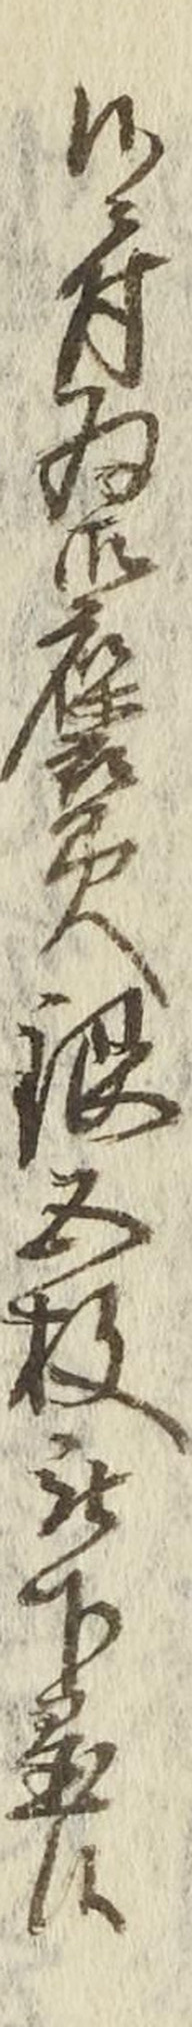候ニ付為御褒美銀五枚被下置候
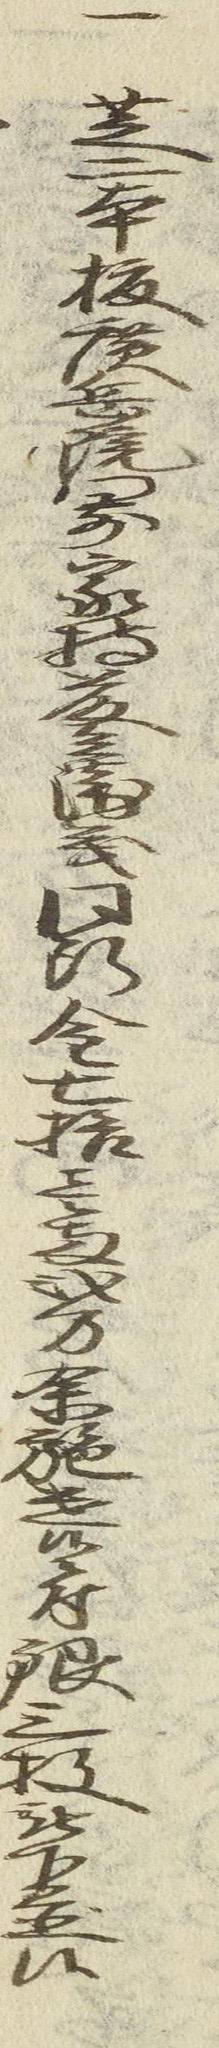一芝ニ本榎広岳院門前家持藤兵衛義同断金七拾壱両弐分余施遣候ニ付銀三枚被下置候
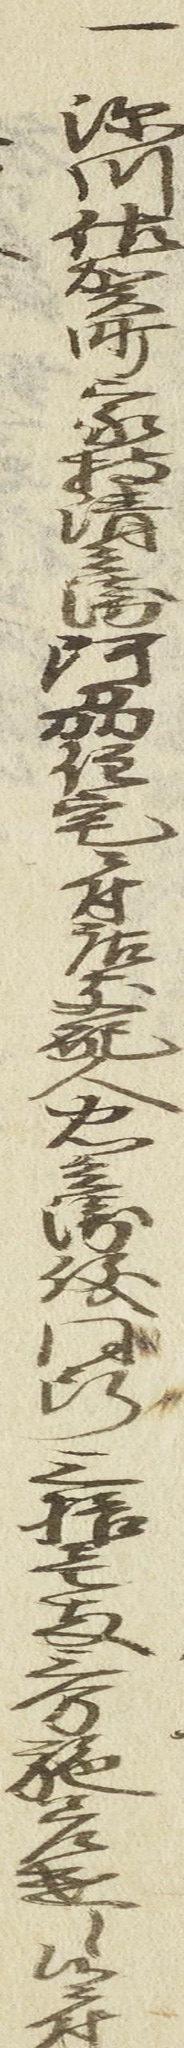一深川佐賀町家持清兵衛阿州住宅ニ付店支配人忠兵衛儀同断三拾壱両三分施差遣し候ニ付
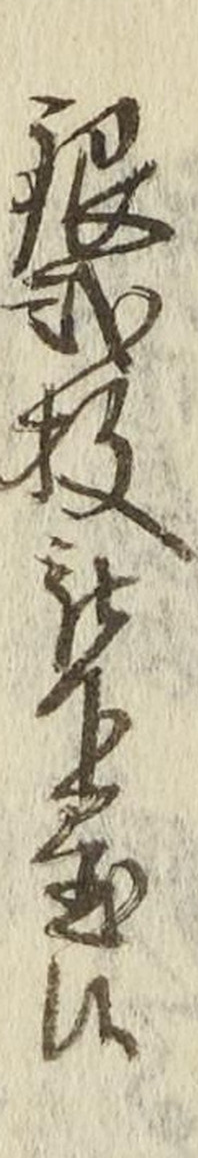銀弐枚被下置候
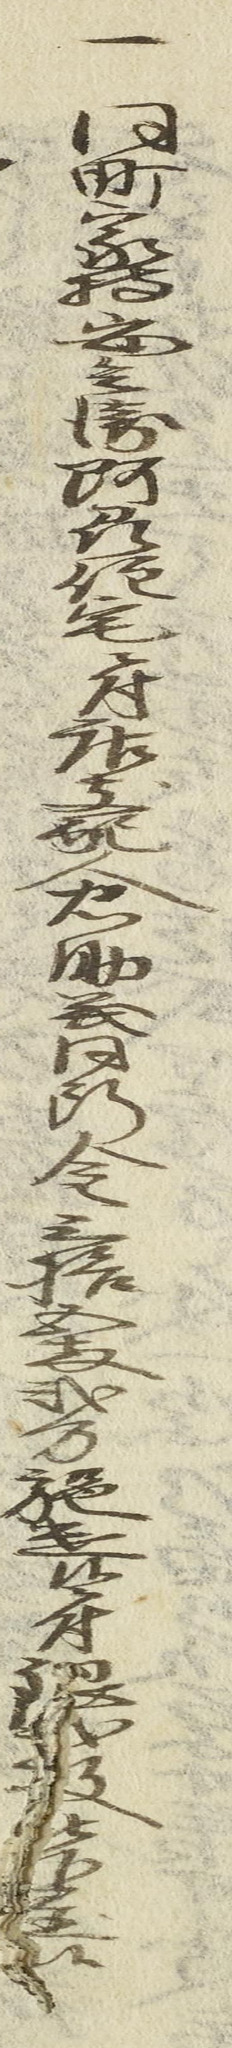一同町家持安兵衛阿州住宅ニ付店支配人忠助義同断金三拾五両弐分施遣候ニ付銀弐枚被下置候
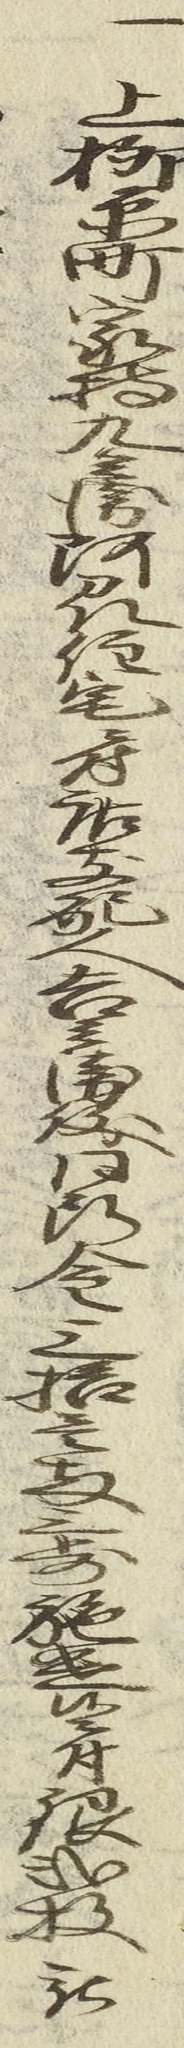一上柳原町家持九兵衛阿州住宅ニ付店支配人吉兵衛儀同断金三拾壱両三歩施遣候ニ付銀弐枚被
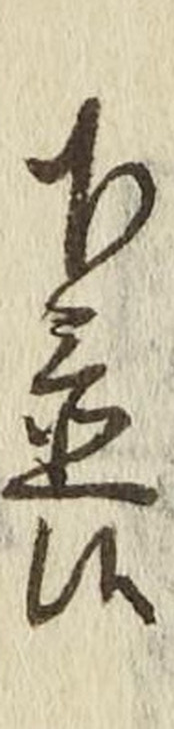下置候
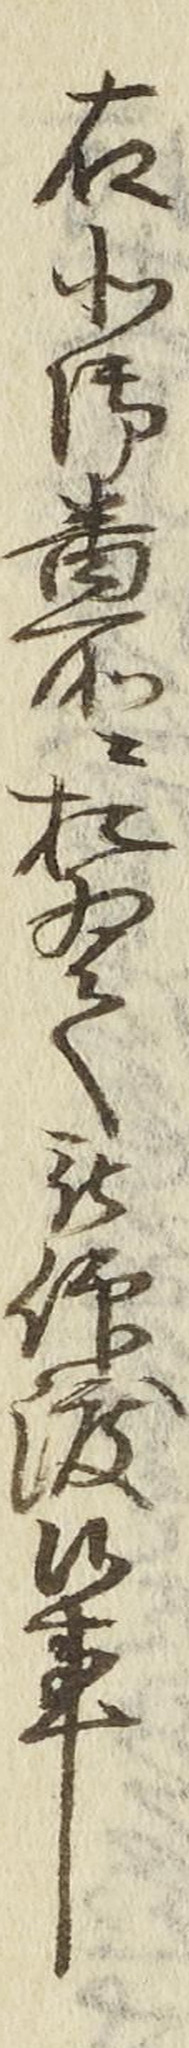右北御番所ニ於ゐて被仰渡候事
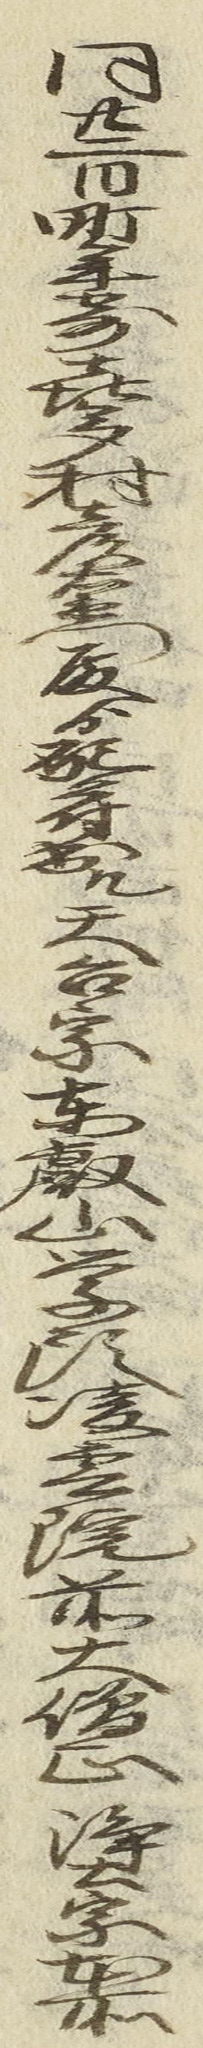一同廿ニ日町年寄喜多村彦右衛門殿ゟ配符出ル天台宗東叡山学頭凌雲院前大僧正浄土宗本所
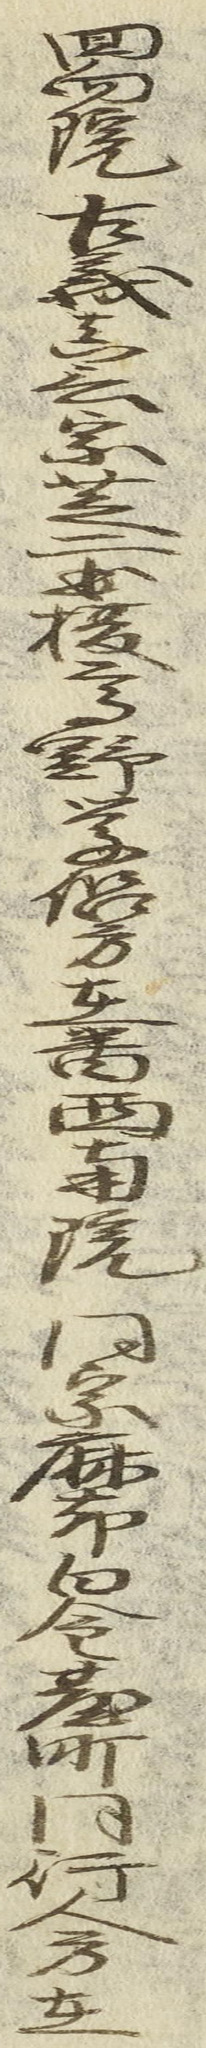回向院古義真言宗芝ニ本榎高野学侶方在番西南院同宗麻布白金台町同行人方在
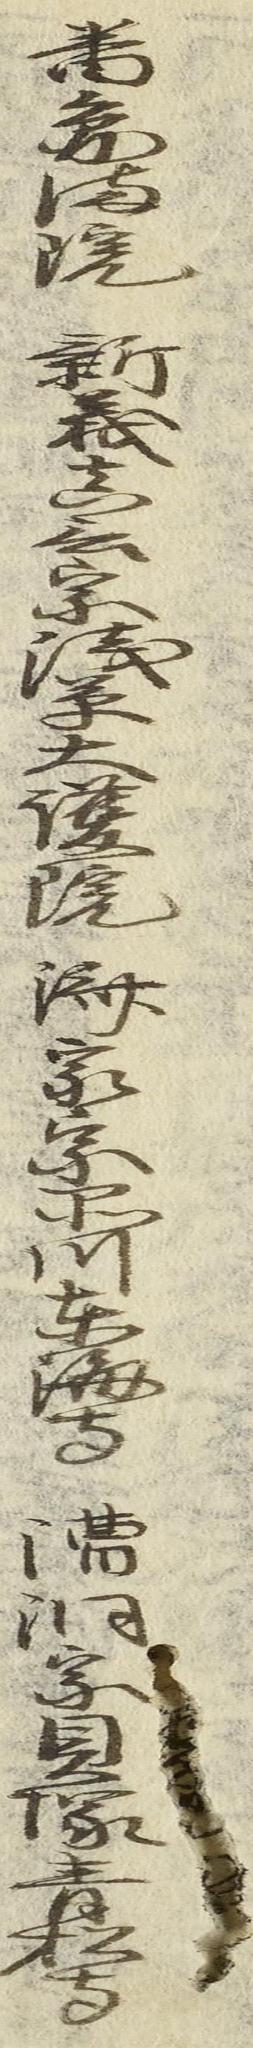番円満院新義真言宗浅草大護院済家宗品川東海寺漕洞宗貝塚青松寺
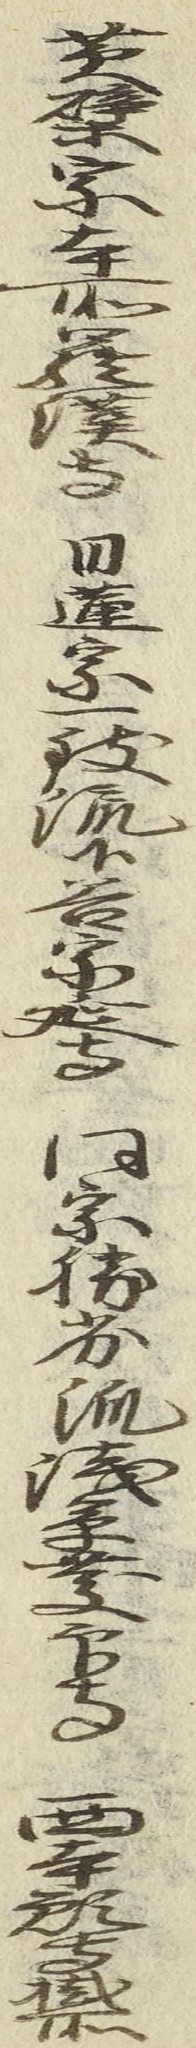黄檗宗本所羅漢寺日蓮宗一致流下谷宗延寺同宗勝劣派浅草慶印寺西本願寺掛所
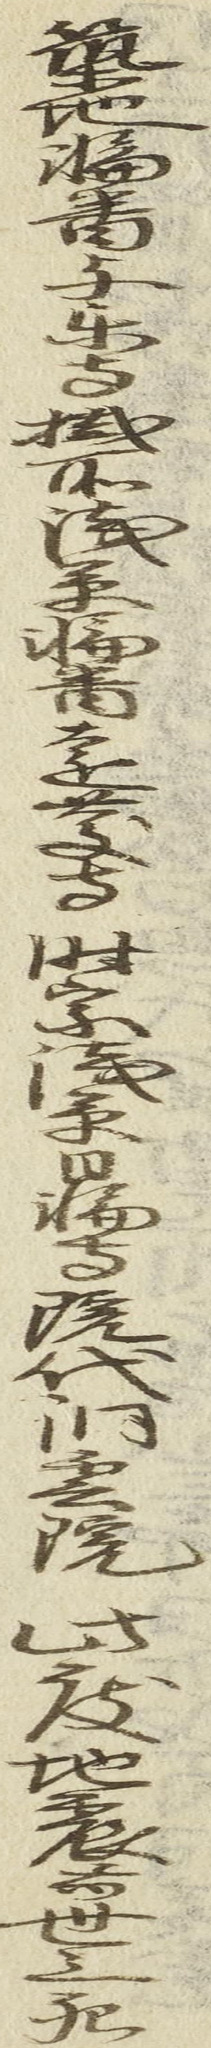築地輪番与楽寺掛所浅草輪番遠慶寺時宗浅草日輪寺院代洞雲院此度地震ニ而世上死
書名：安政二年震災記事　完
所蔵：東京大学地震研究所図書室 Earthquake Research Institute Library, The University of Tokyo, JAPAN
